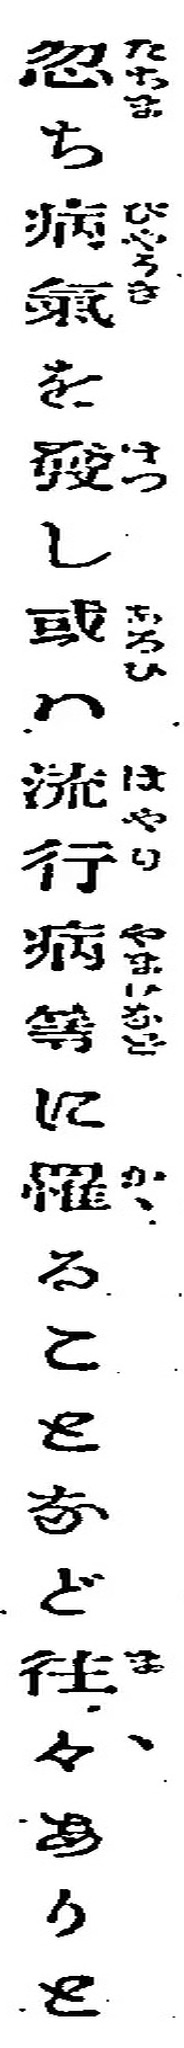忽ち病気を発し或は流行病等に罹ることなど往々ありと
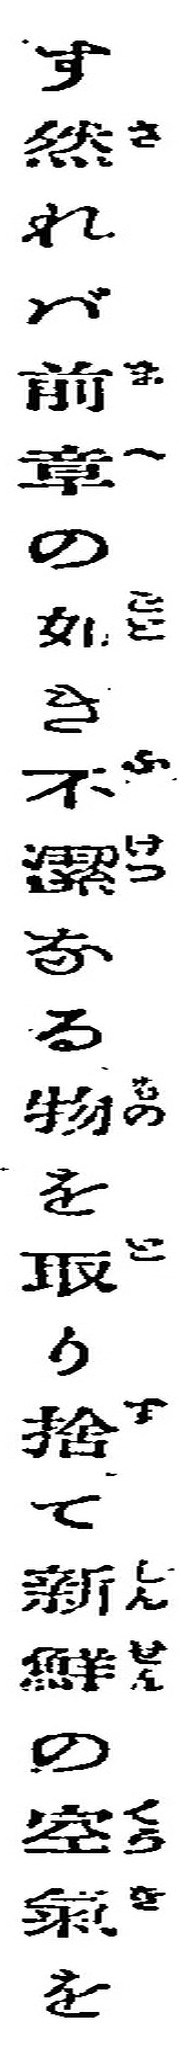す然れば前章の如き不潔なる物を取り捨て新鮮の空気を
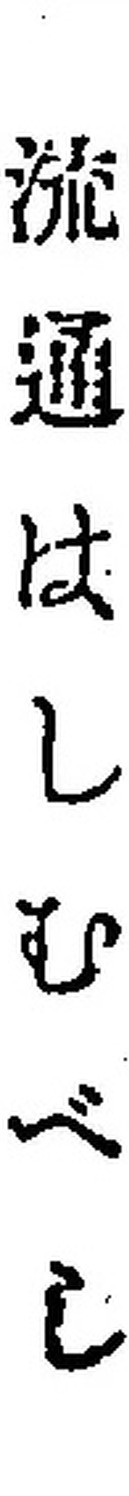流通はしむべし
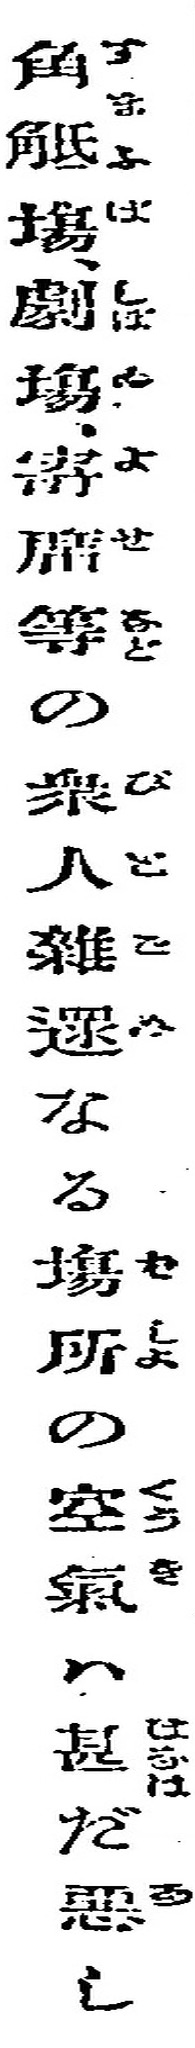角觝場、劇場、寄席等の衆人雑遝なる場所の空気は甚だ惡し
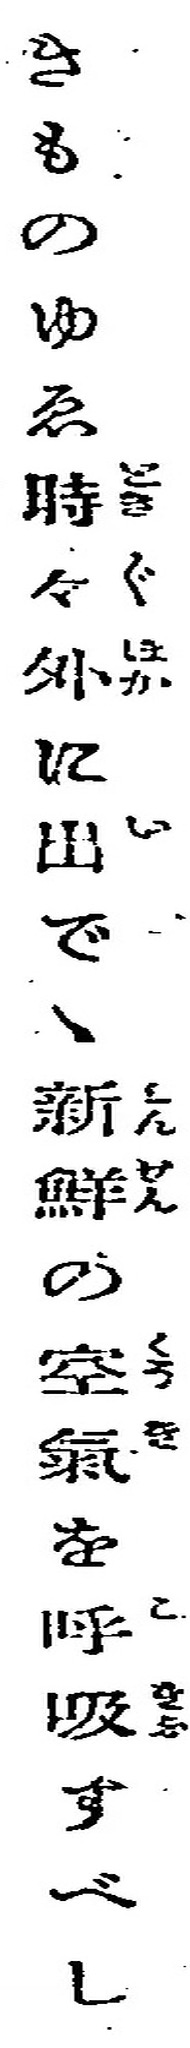きものゆゑ時々外に出でゝ新鮮の空気を呼吸すべし
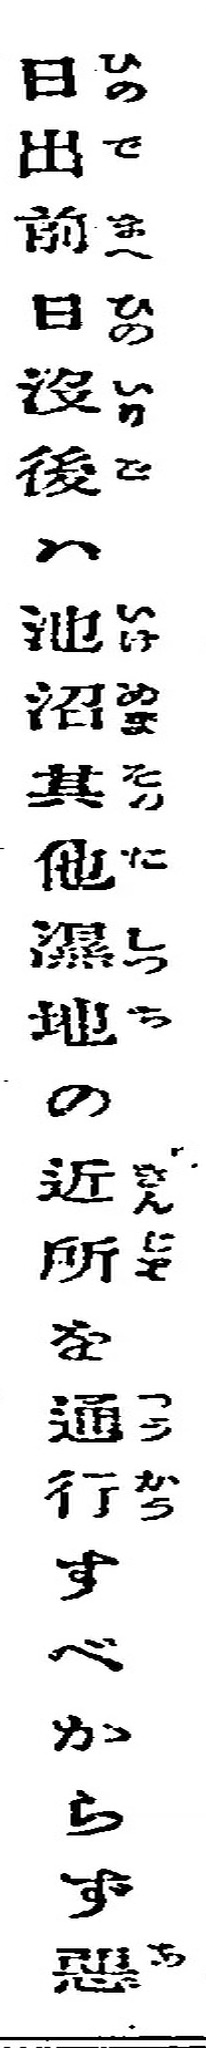日出前日没後は池沼其他湿地の近所を通行すべからず惡
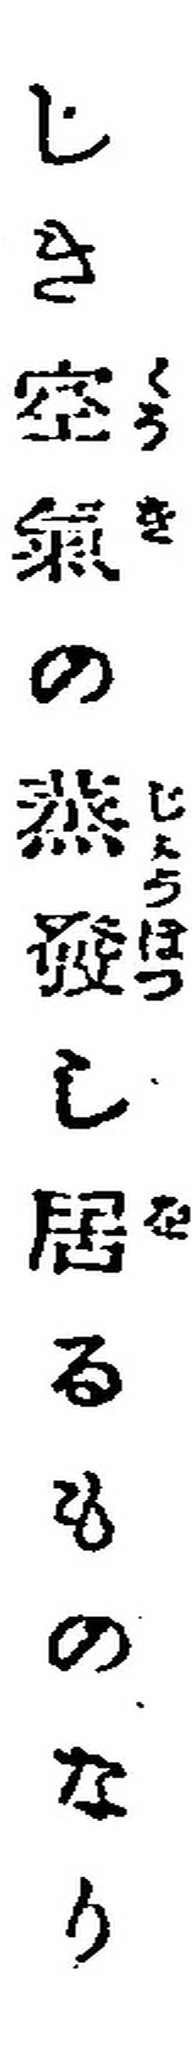しき空気の蒸発し居るものなり
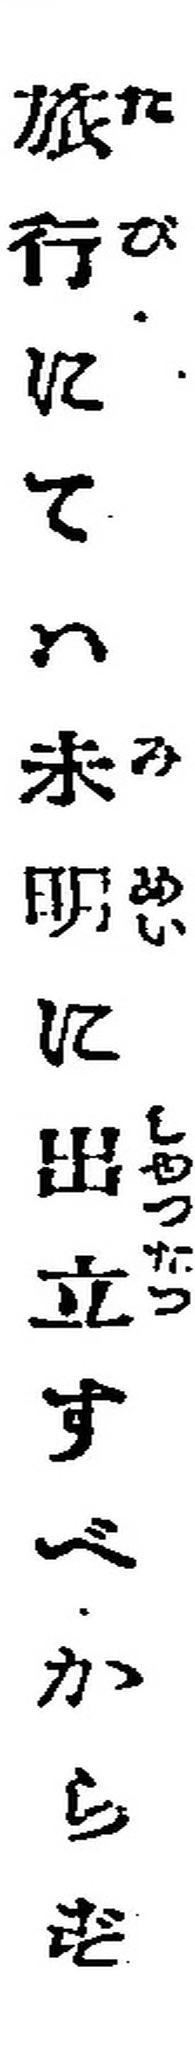旅行にては未明に出立すべからず
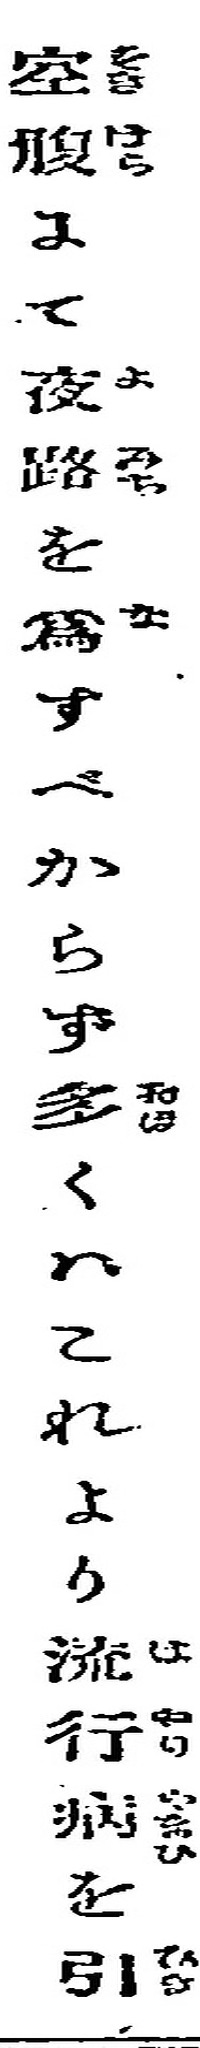空腹にて夜路を為すべからず多くはこれより流行病を引
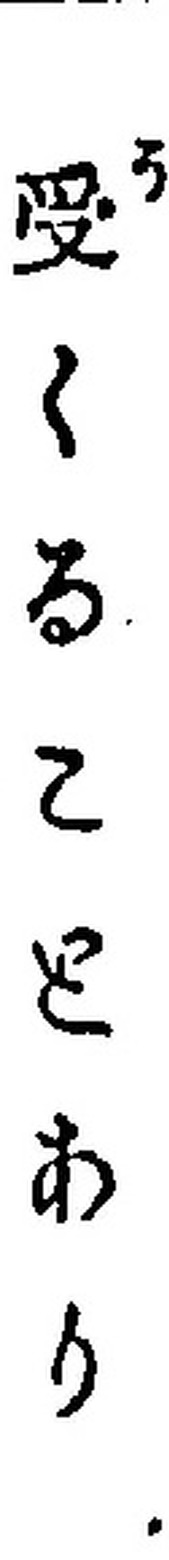受くることあり
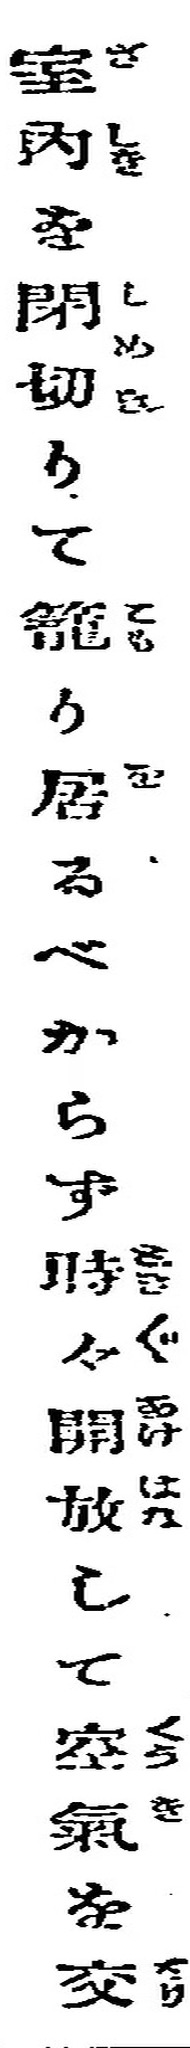室内を閉切りて籠り居るべからず時々開放して空気を交
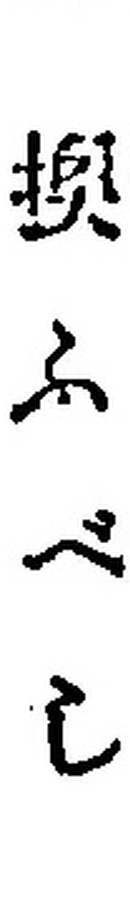換ふべし
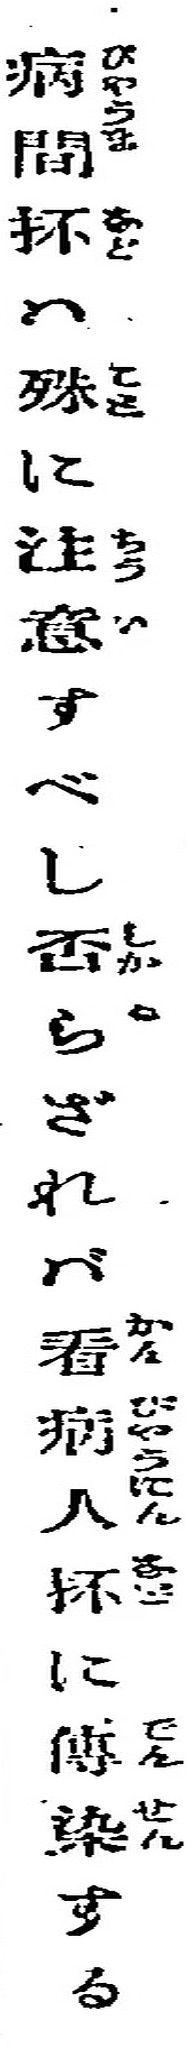病間抔は殊に注意すべし否らざれば罐病人抔に傳染する

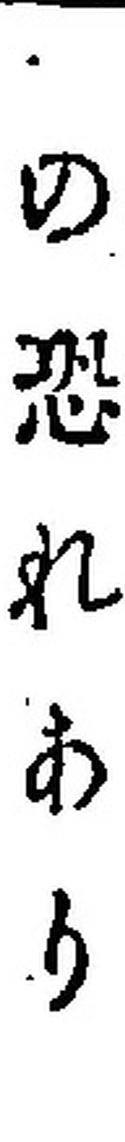の恐れあり
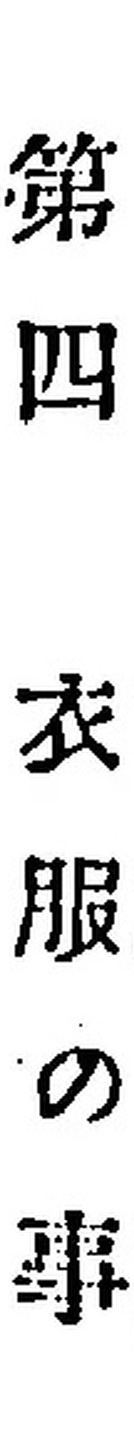第四衣服の事
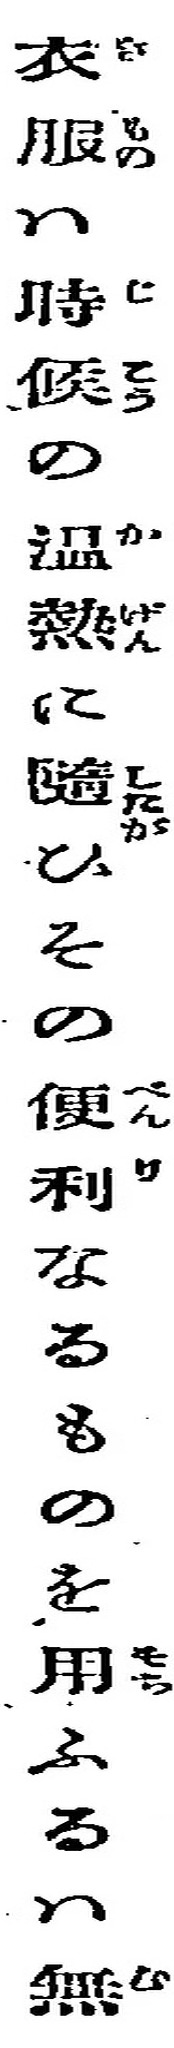衣服は時候の温熱に随ひその便利なるものを用ふるは無
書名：新撰暑中養生法 : 附・コレラ予防歌
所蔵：国立国会図書館 National Diet Library, JAPAN
